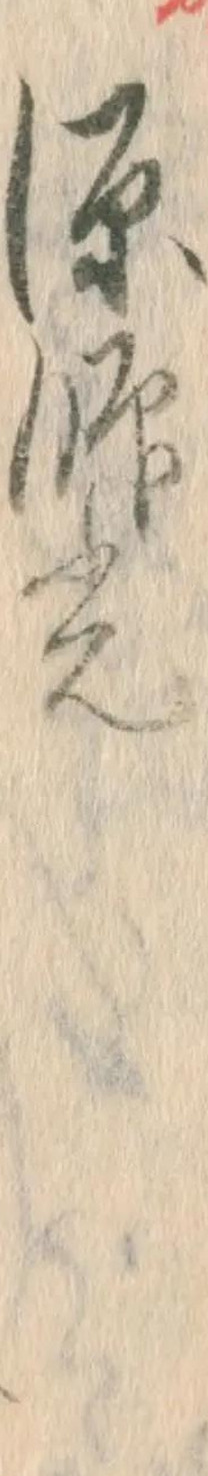源師光
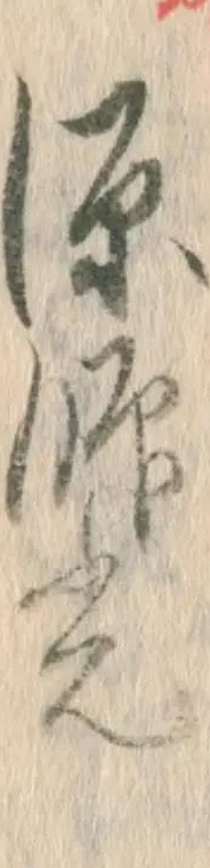源師光
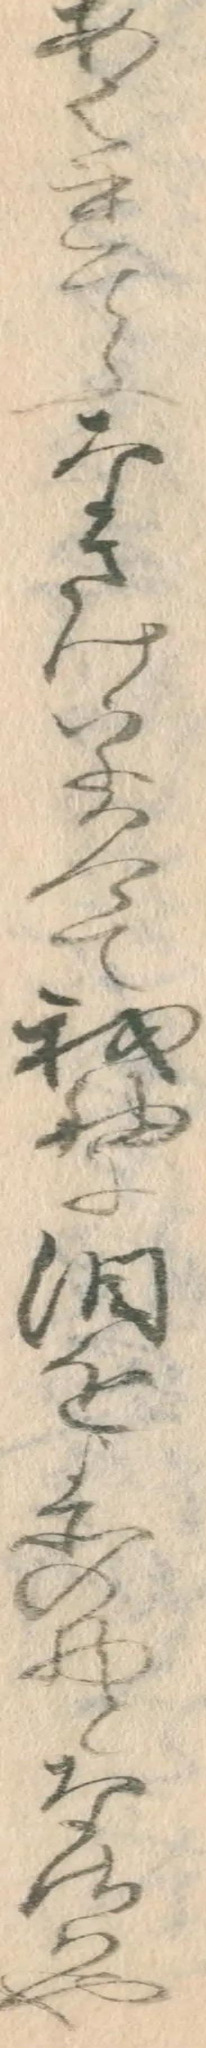あはれてふなさけをかけて我袖に涙をよその物となさはや
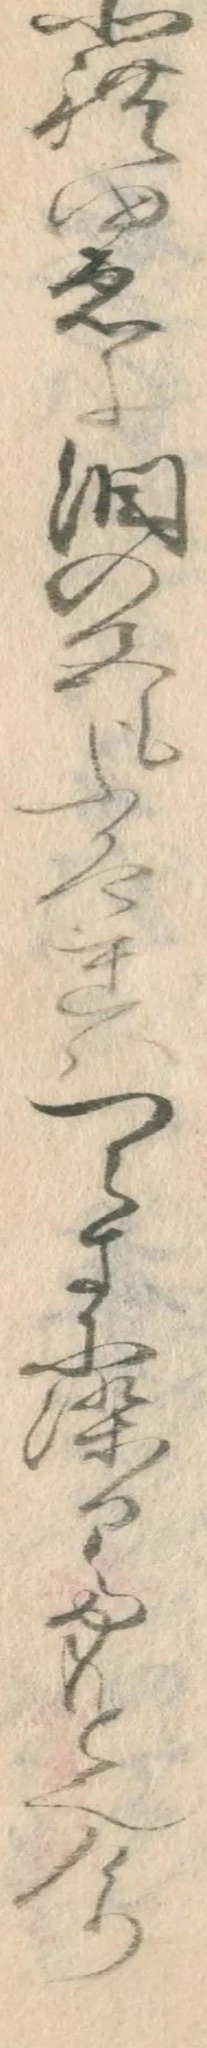それゆゑに涙の色もふかけれはつらきに染るたもと也けり
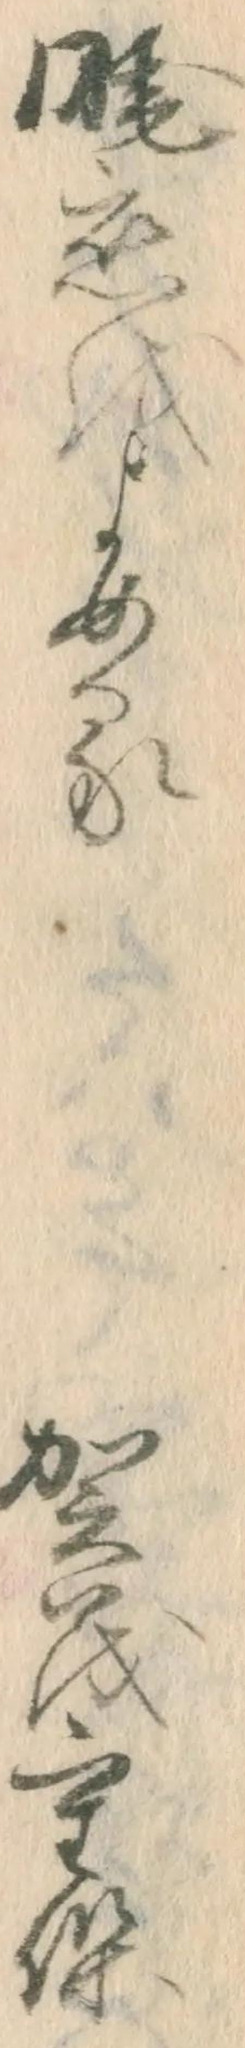暁恋をよめる賀茂重保

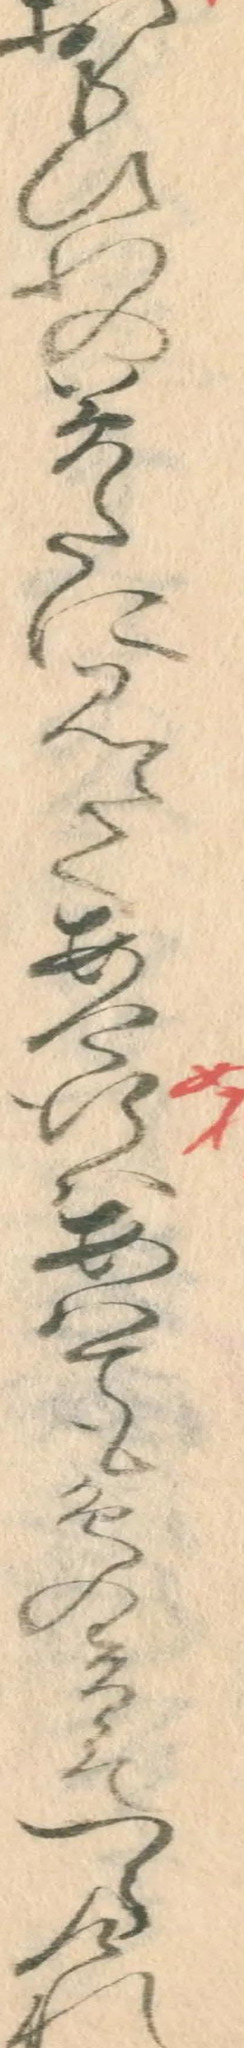おもひねの夢たに見えてあけ行はあはても鳥の音そつらけれ
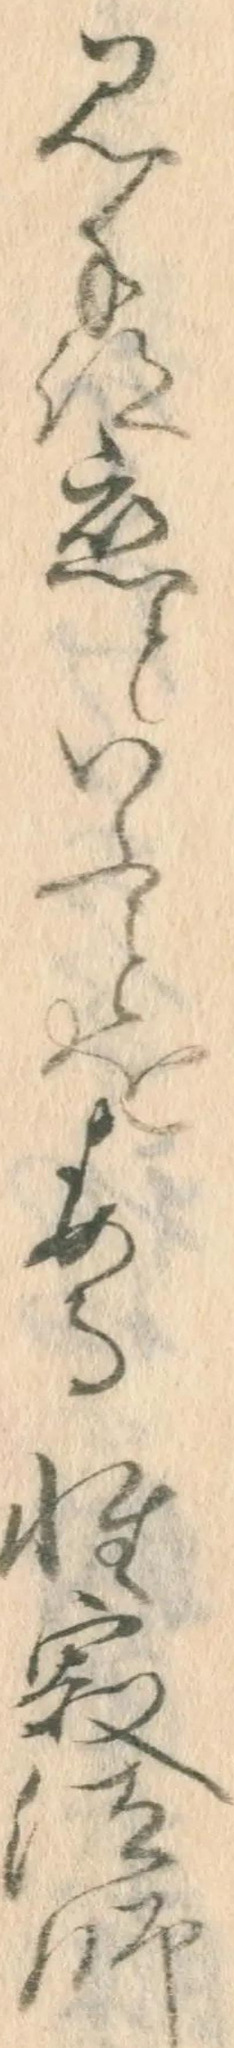見手跡恋といふことをよめる性寂法師
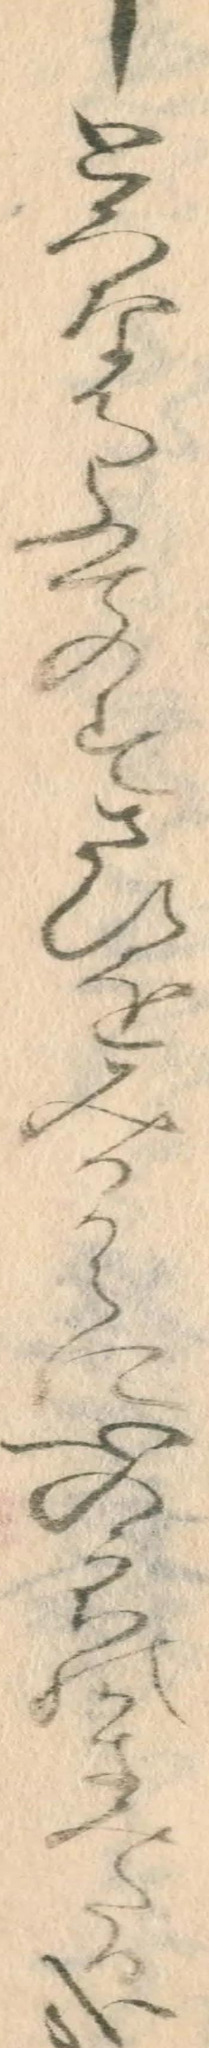しとろなるふてのすさひをみるからに心のうちのかきみたる哉
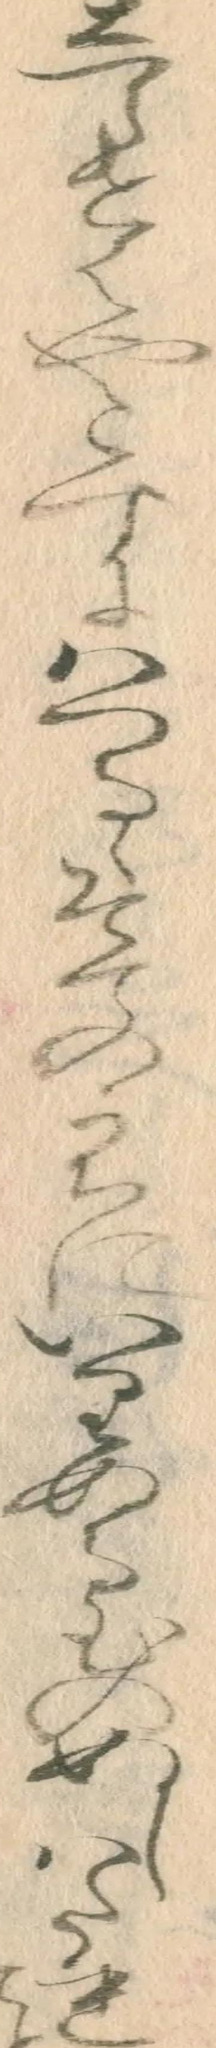しらせはやこすにはつるゝそてのうちにいりぬる玉のぬしはたれそと
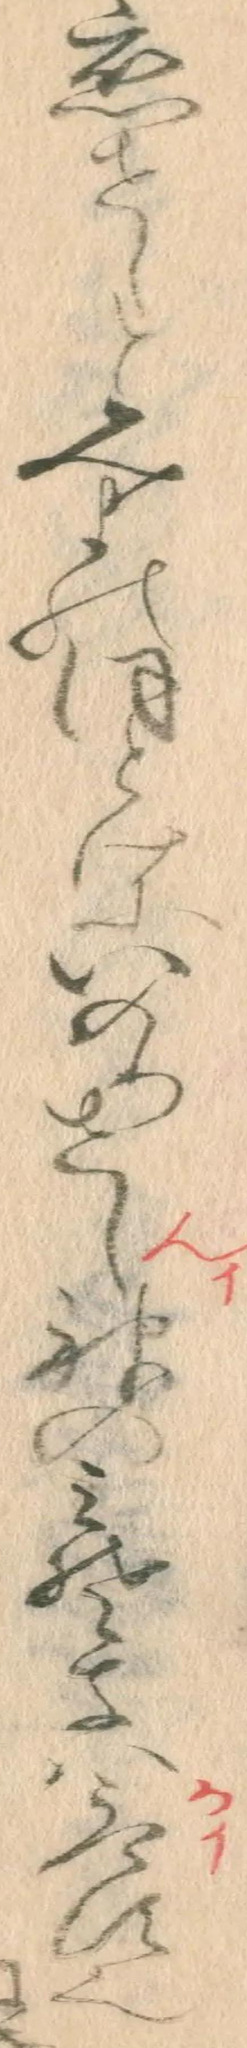恋せしとみよのほとけにいのりせし神のみそきはうけす也にき
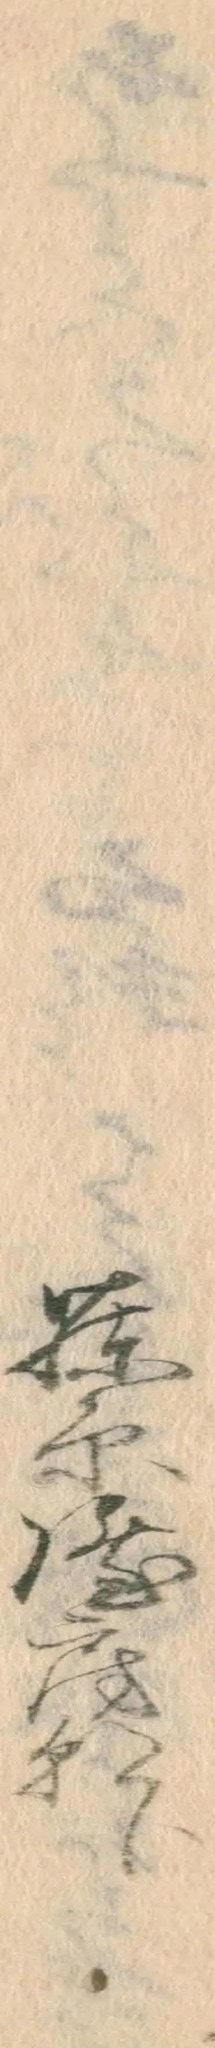藤原隆房朝臣
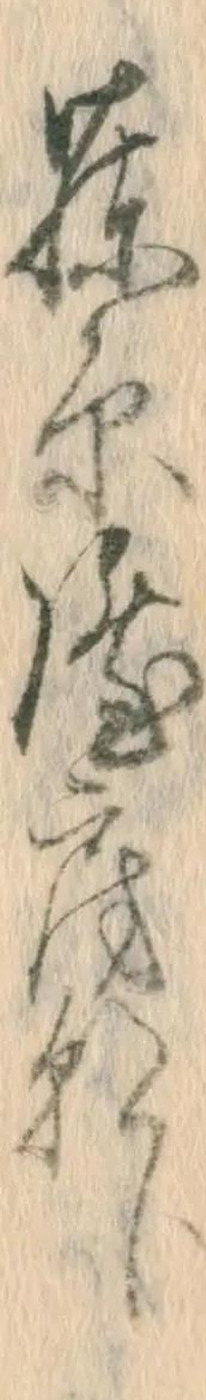藤原隆房朝臣
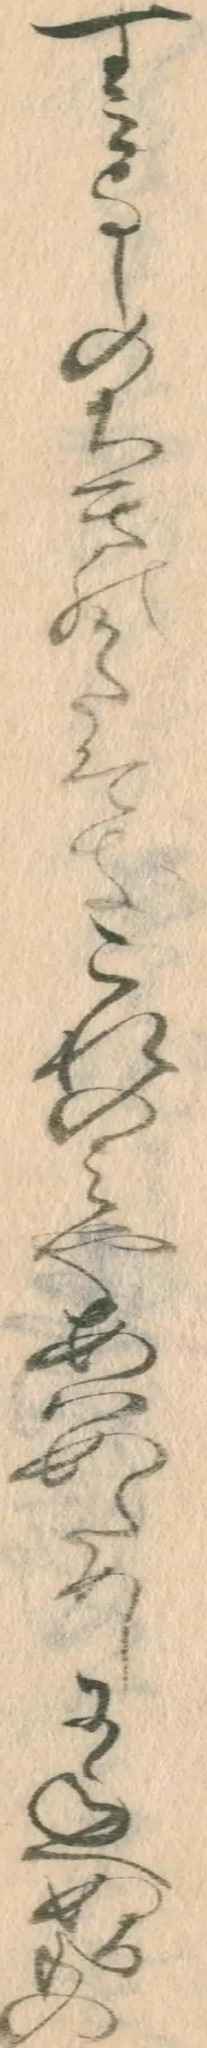すみよしのちきのかたそきこれのみやあはぬためしに年へぬるもの
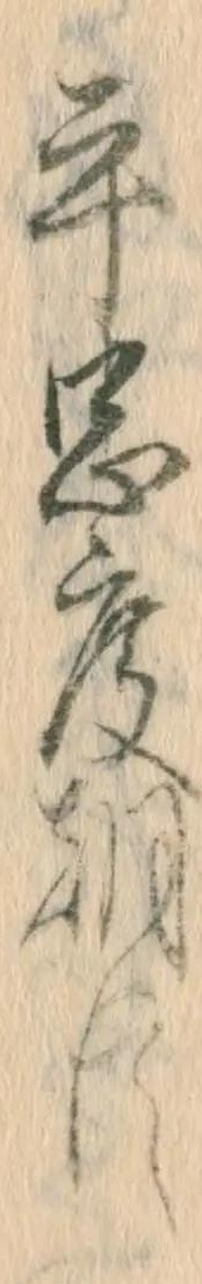平忠度朝臣
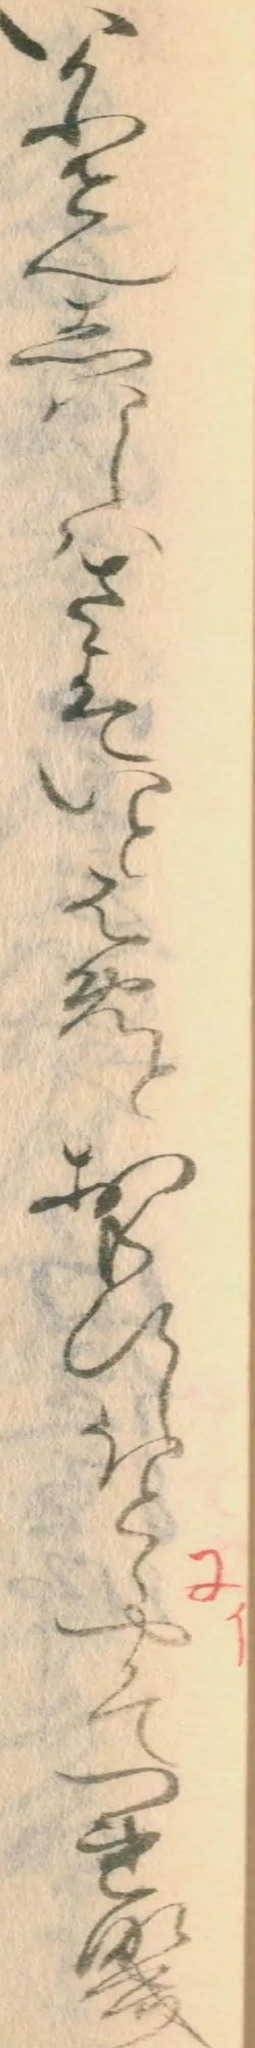いかにせんしはしはさこそいとはめとおもひしほとゝやかてつれなき
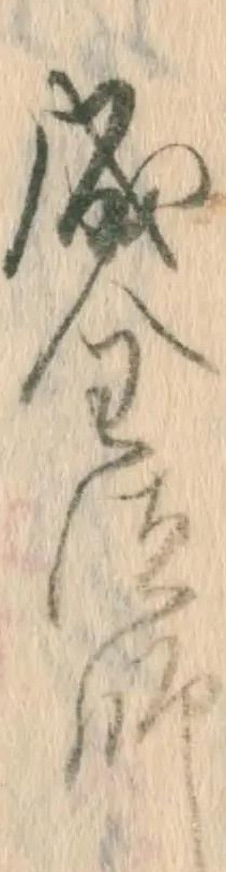成全法師
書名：月詣和歌集
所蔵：国立国会図書館 National Diet Library, JAPAN
